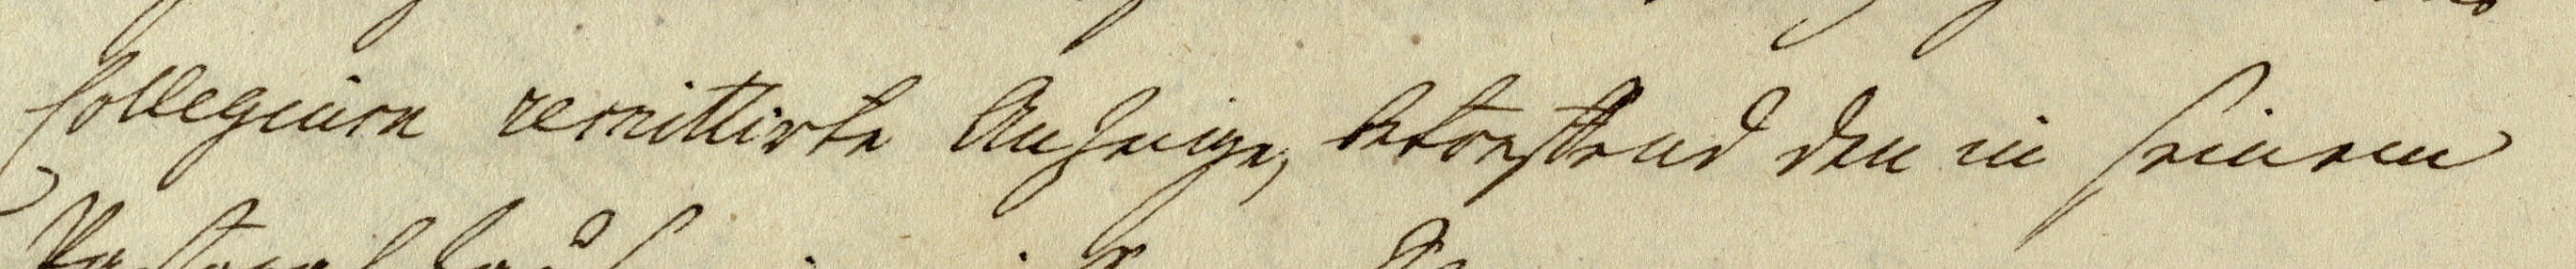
Collegium remittirte Anzeige, betreffend den in seinem
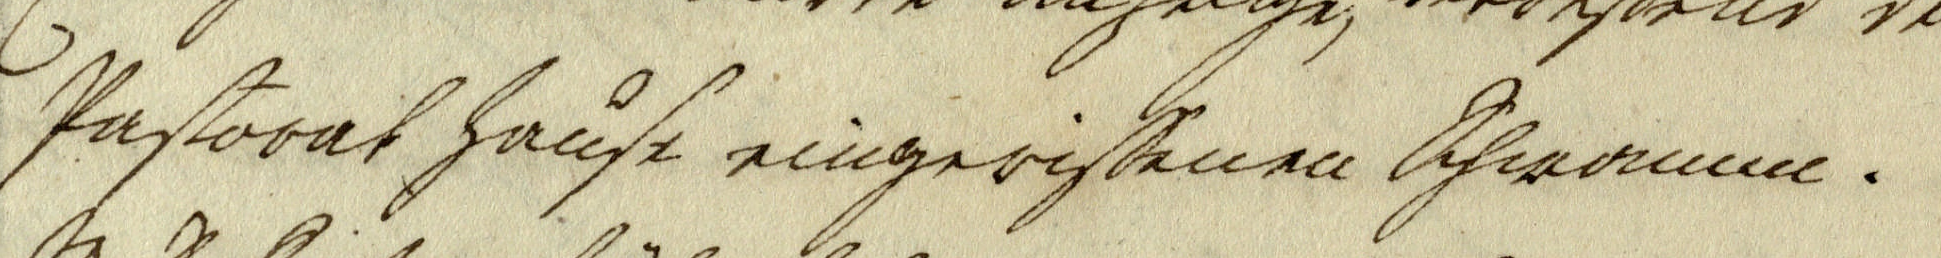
Pastorat Hause eingerissenen Schwamm.
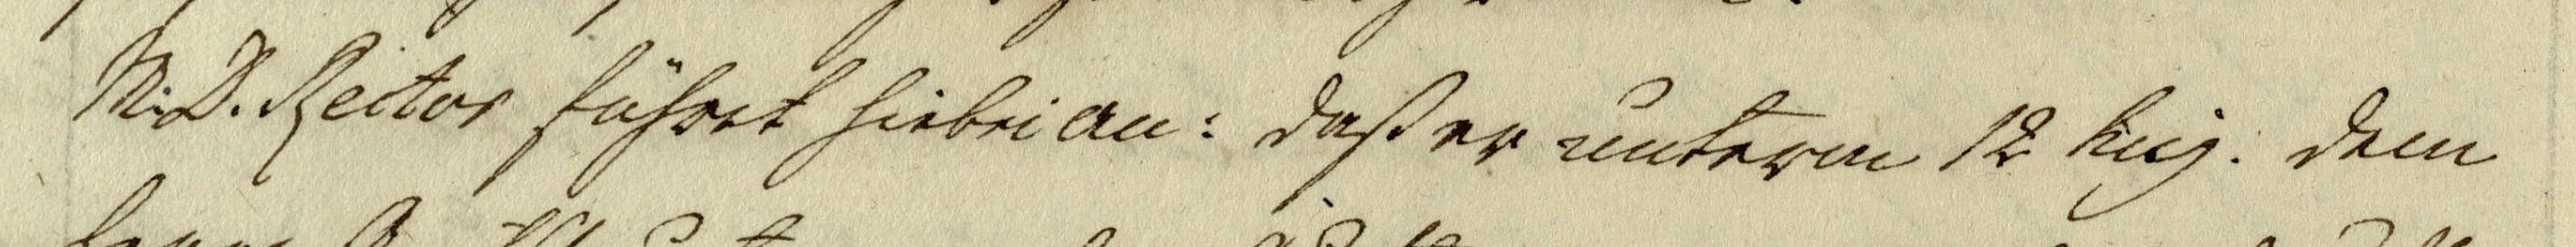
M. D. Rector führet hiebei an: daß er unterm 12 huj. dem
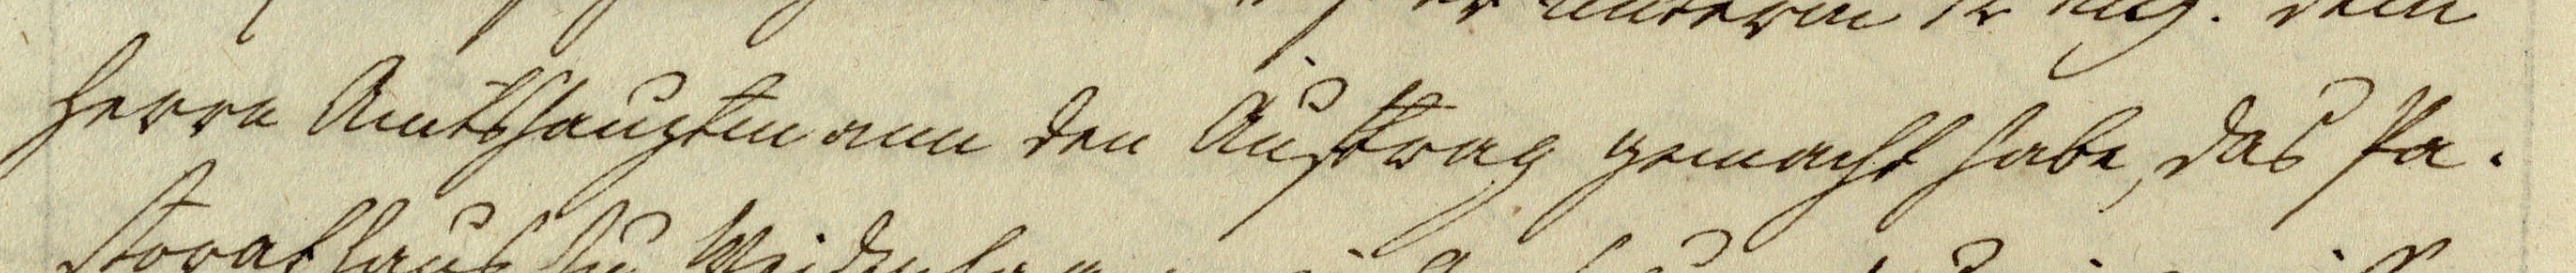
Herrn Amtshauptmann den Auftrag gemacht habe, das Pa¬
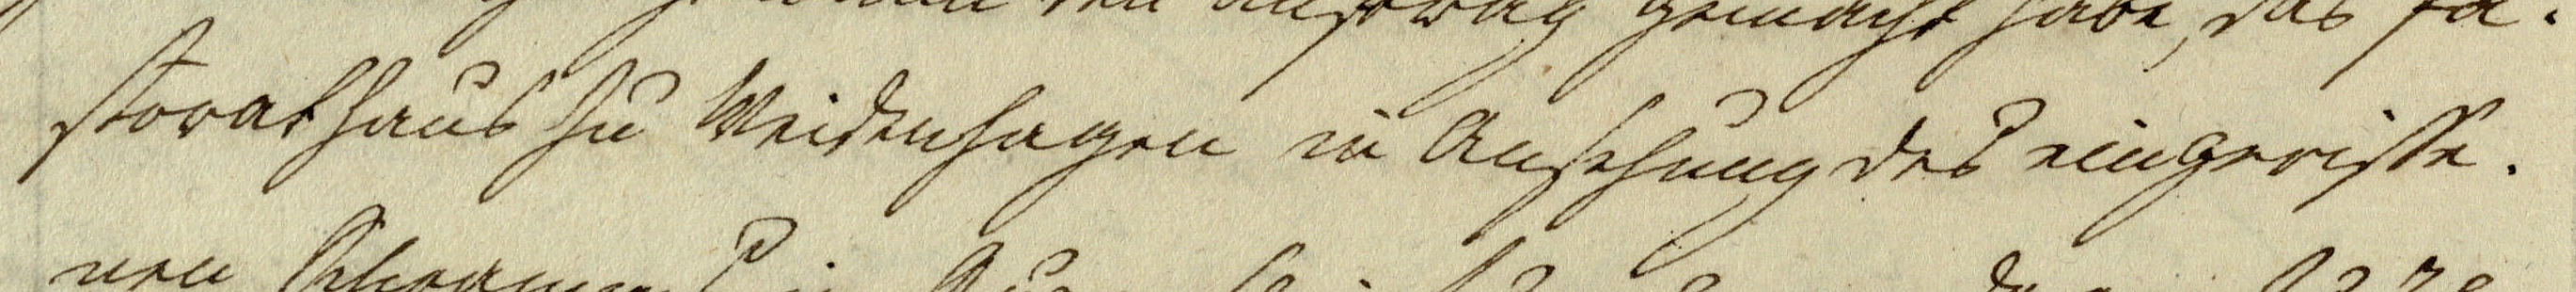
storathaus zu Weidenhagen in Ansehung des eingerisse¬
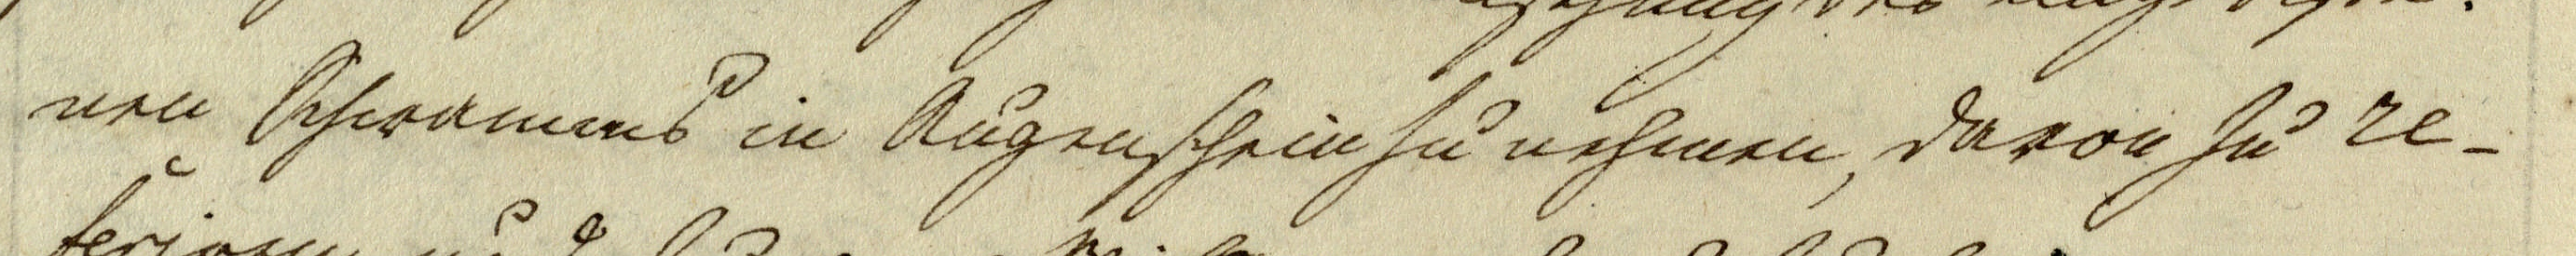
nen Schwamms in Augenschein zu nehmen, davon zu re¬
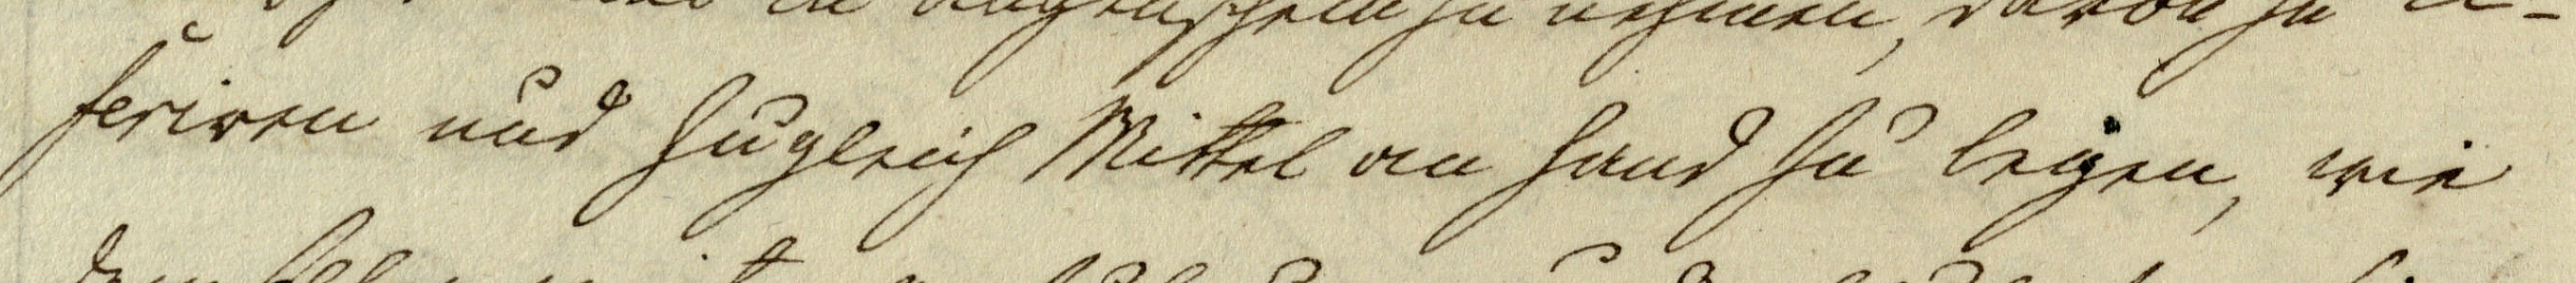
feriren und zugleich Mittel an hand zu legen, wie
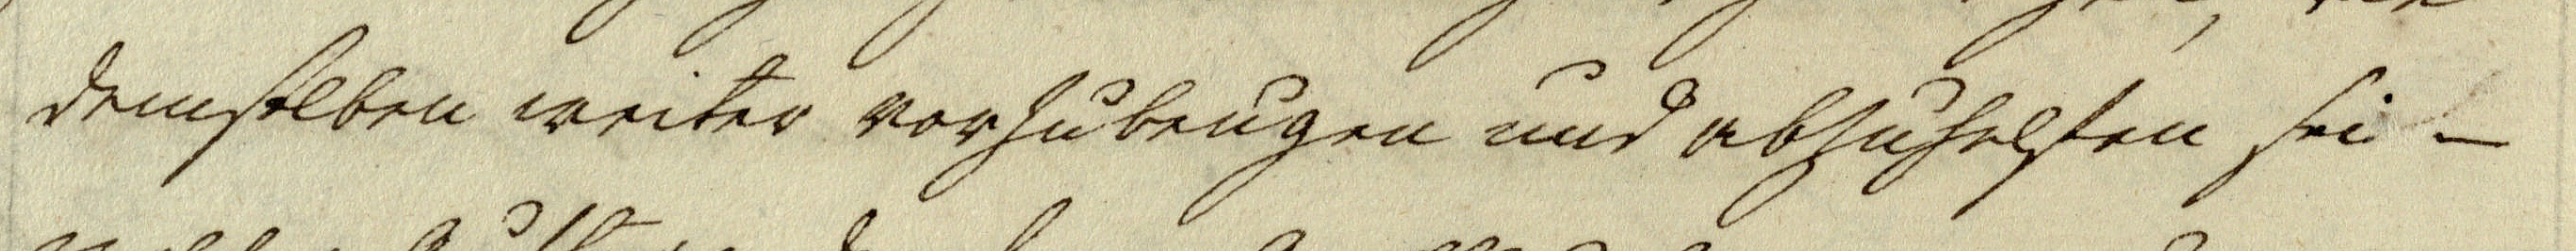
demselben weiter vorzubeugen und abzuhelfen sei,
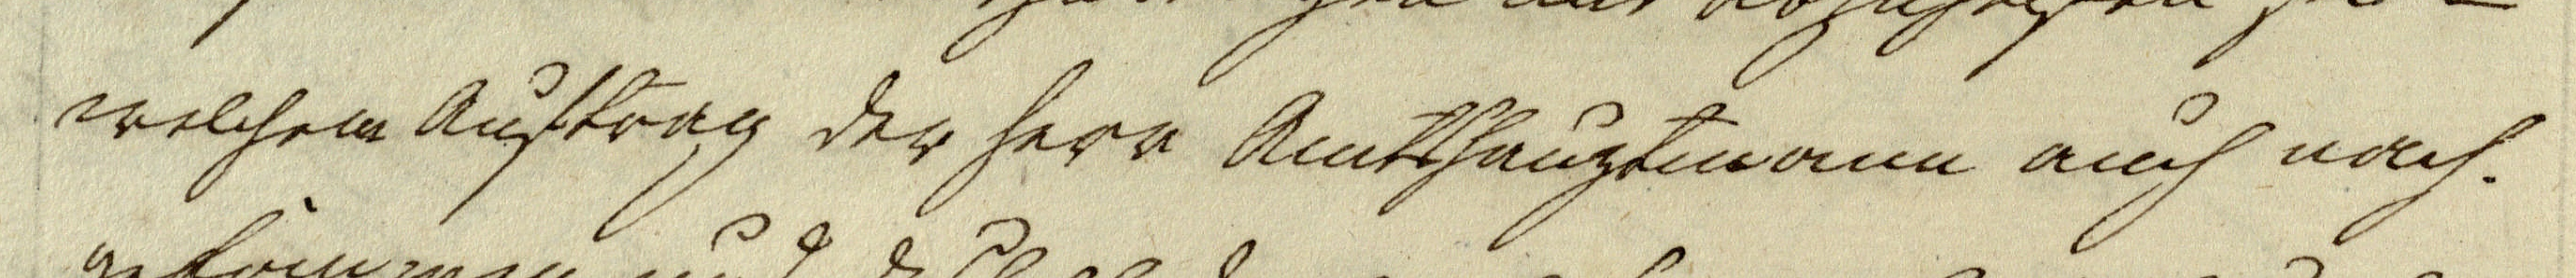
welchem Auftrag der Herr Amtshauptmann auch nach¬
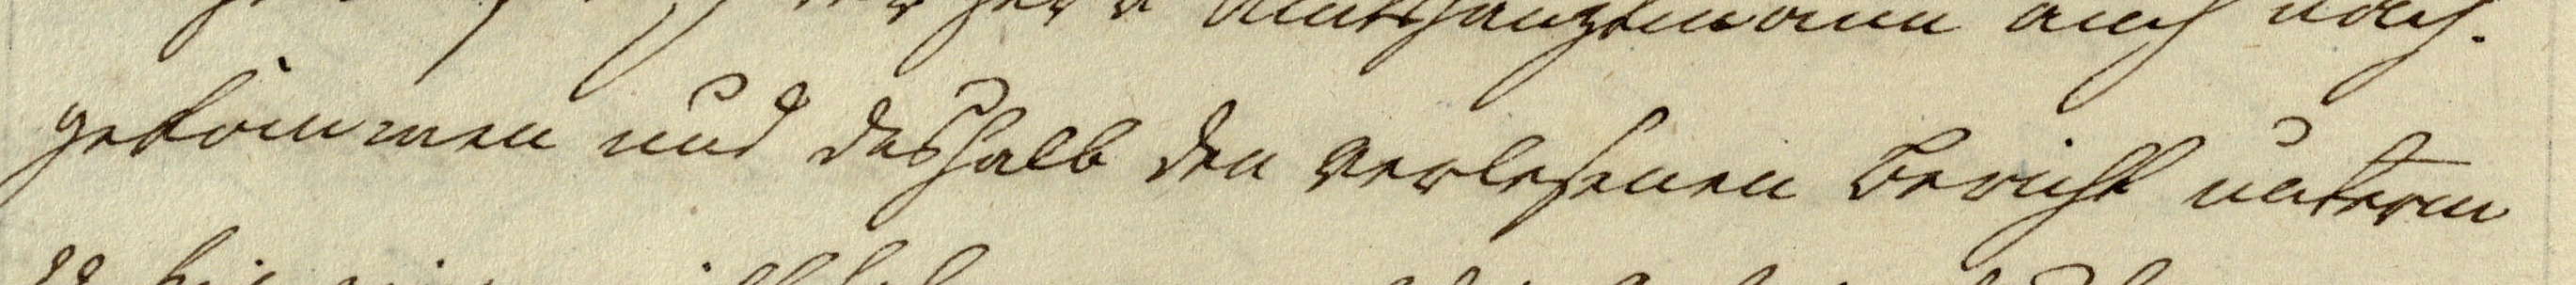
gekommen und deshalb den verlesenen Bericht unterm
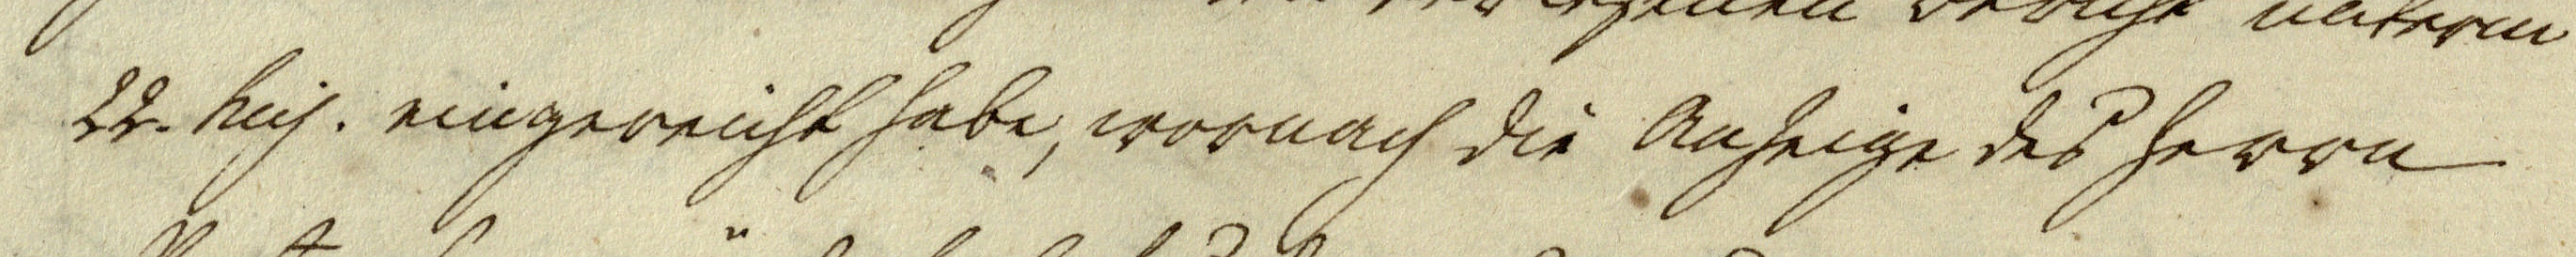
22. huj. eingereicht habe, wornach die Anzeige des Herrn
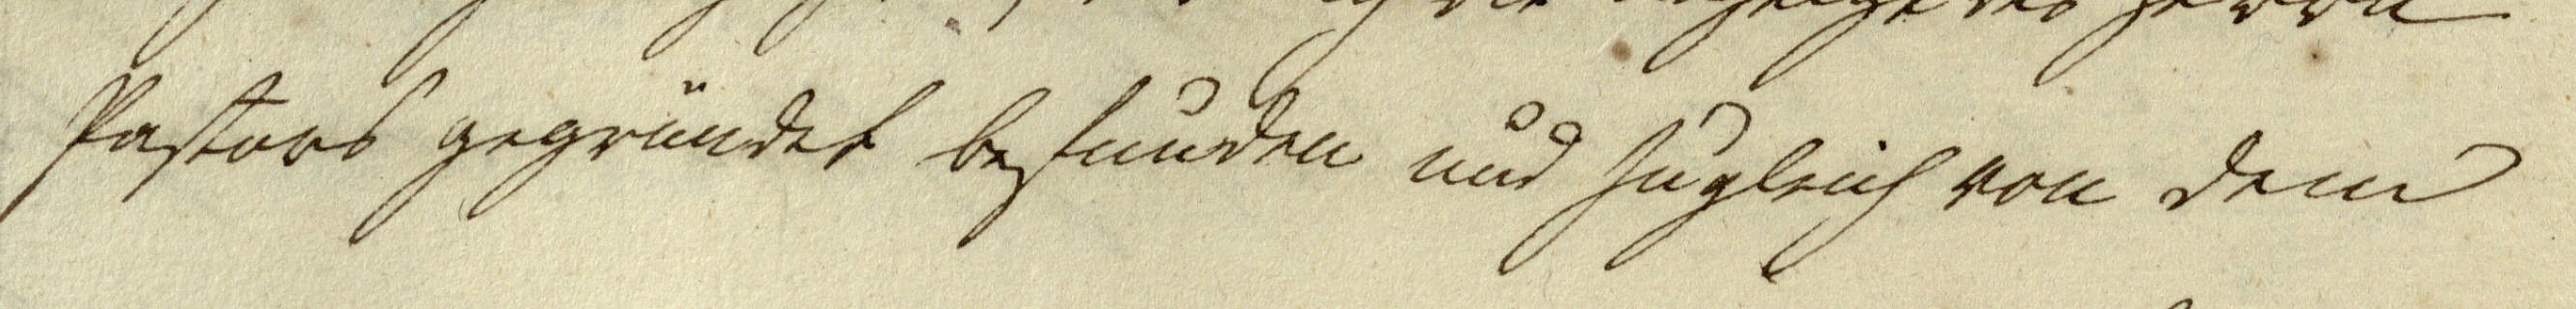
Pastors gegründet befunden und zugleich von dem
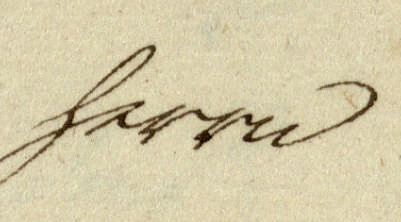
Herrn
